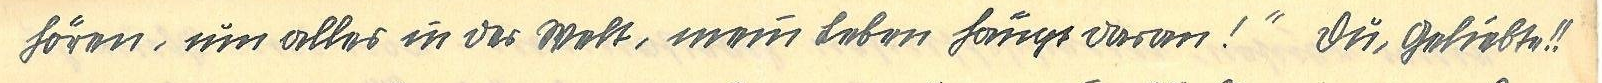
hören, um alles in der Welt, mein Leben hängt daran!” Du, Geliebte!!
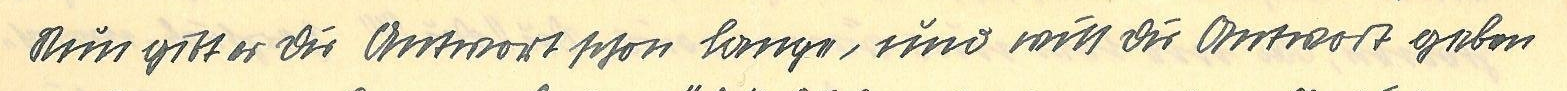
Nun gibt er Dir Antwort schon lange, und will Dir Antwort geben
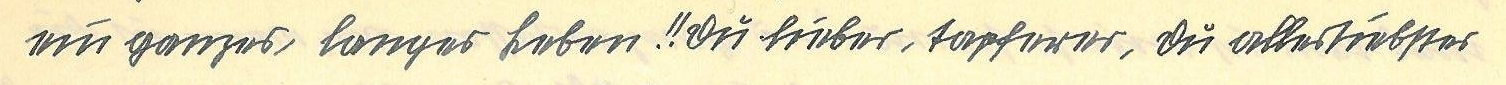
ein ganzes, langes Leben!! Du lieber, tapferer, Du allerliebster
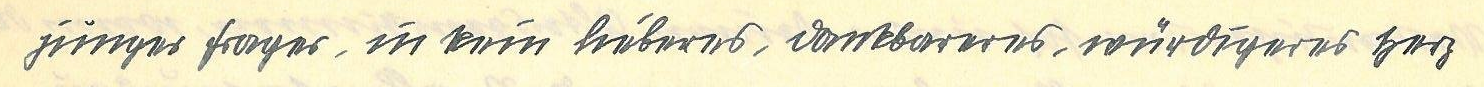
junger Frager, in kein lieberes, dankbareres, würdigeres Herz
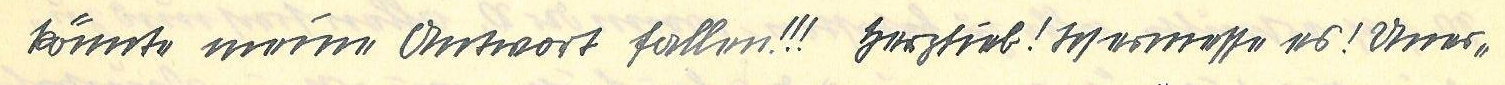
könnte meine Antwort fallen!!! Herzlieb! Ich ermesse es! Uner¬
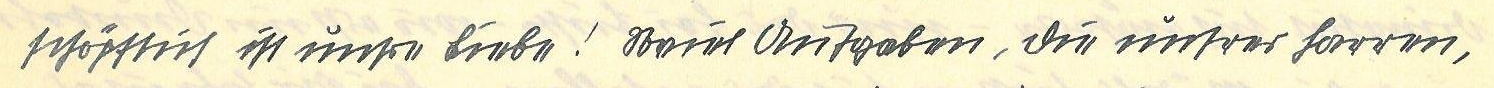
schöpflich ist unsre Liebe! Soviel Aufgaben, die unsrer harren,
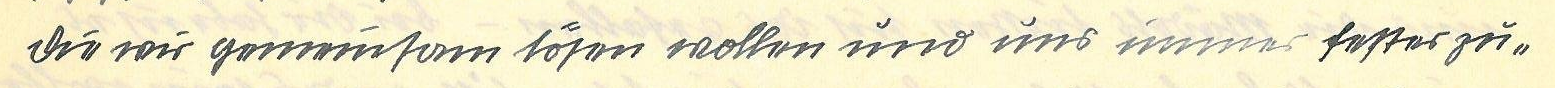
die wir gemeinsam lösen wollen und uns immer fester zu¬
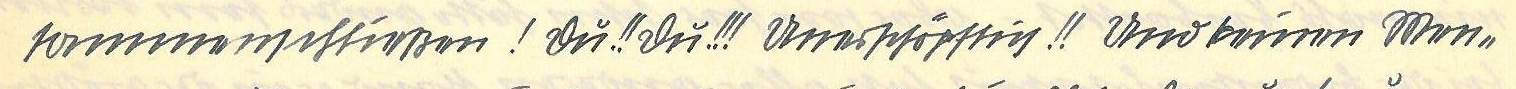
sammenschließen! Du!! Du!!! Unerschöpflich!! Und keinen Men¬
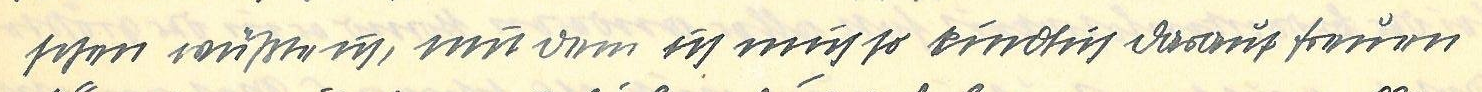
schen wüßte ich, mit dem ich mich so kindlich darauf freuen
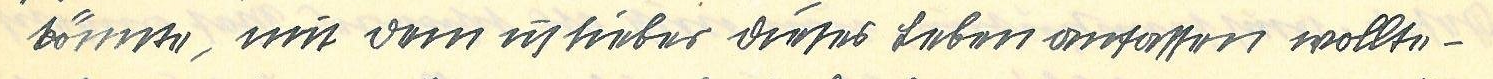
könnte, mit dem ich lieber dieses Leben anfassen wollte –
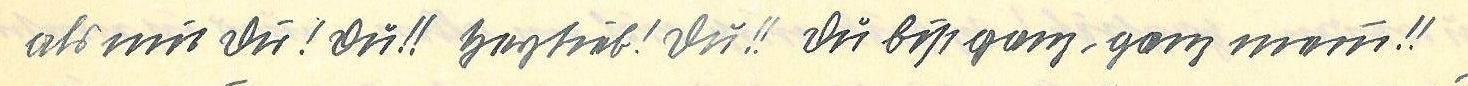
als mit Dir! Du!! Herzlieb! Du!! Du bist ganz, ganz mein!!
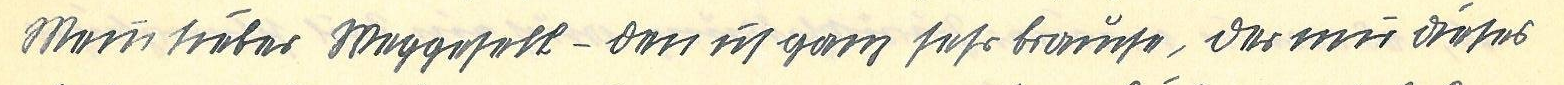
Mein lieber Weggesell – den ich ganz sehr brauche, der mir dieses
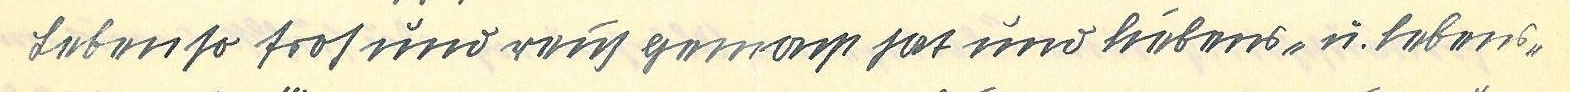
Leben so froh und reich gemacht hat und liebens– u. lebens¬
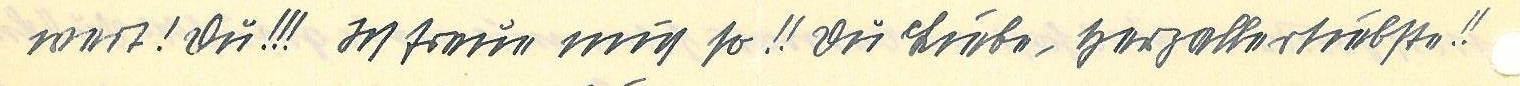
wert! Du!!! Ich freue mich so!! Du Liebe, Herzallerliebste!!
